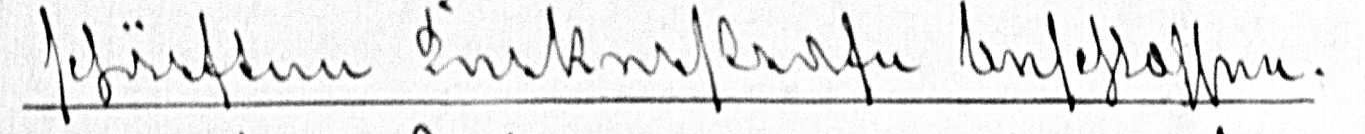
schärften Kerkerstrafe beschlossen.
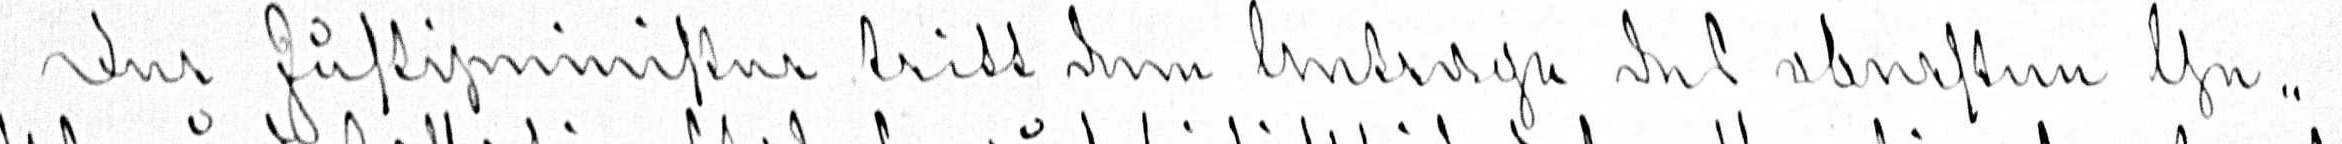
Der Justizminister tritt dem Antrage des obersten Ge¬
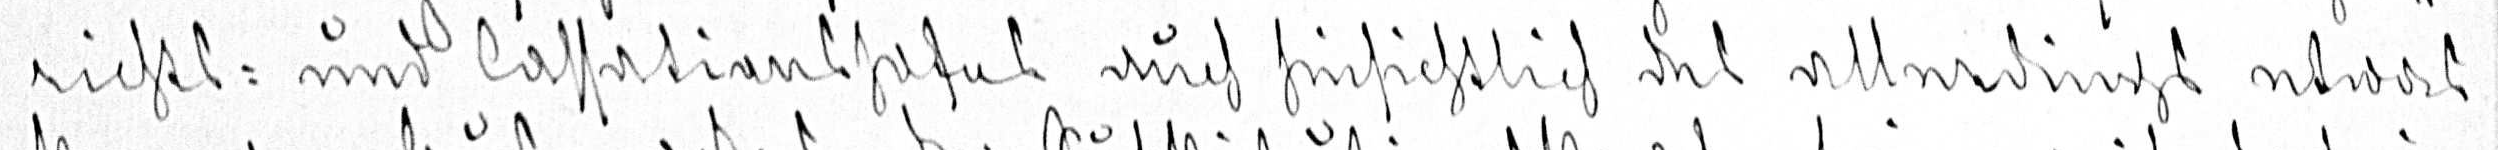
richts- und Cassationshofes auch hinsichtlich des allerdings etwas
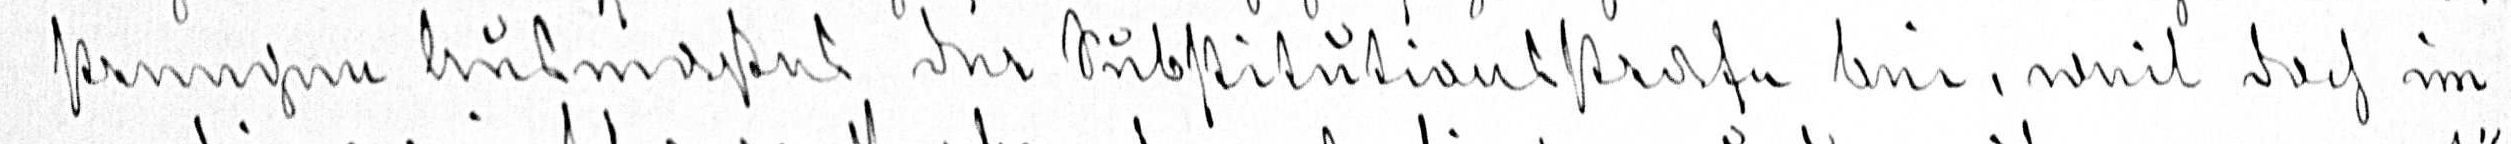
strengen Ausmaßes der Substitutionsstrafe bei, weil doch im¬
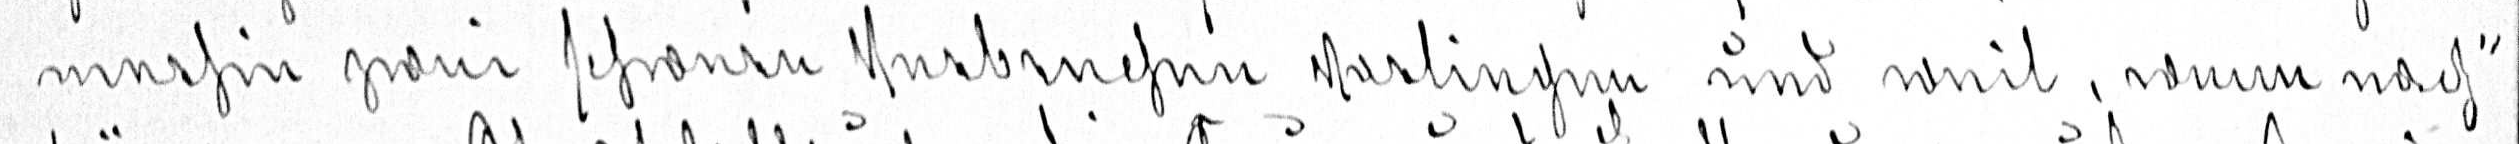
merhin zwei schwere Verbrechen vorliegen und weil, wenn nach¬
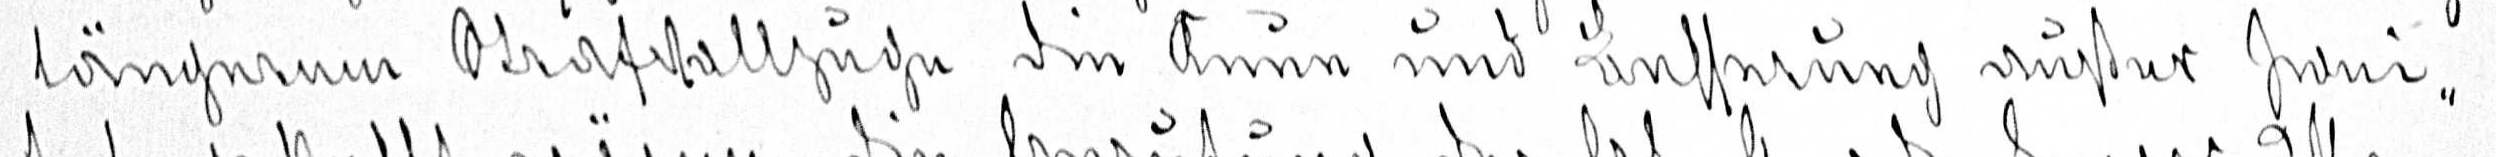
längerem Strafvollzuge die Reue und Besserung außer Zwei¬
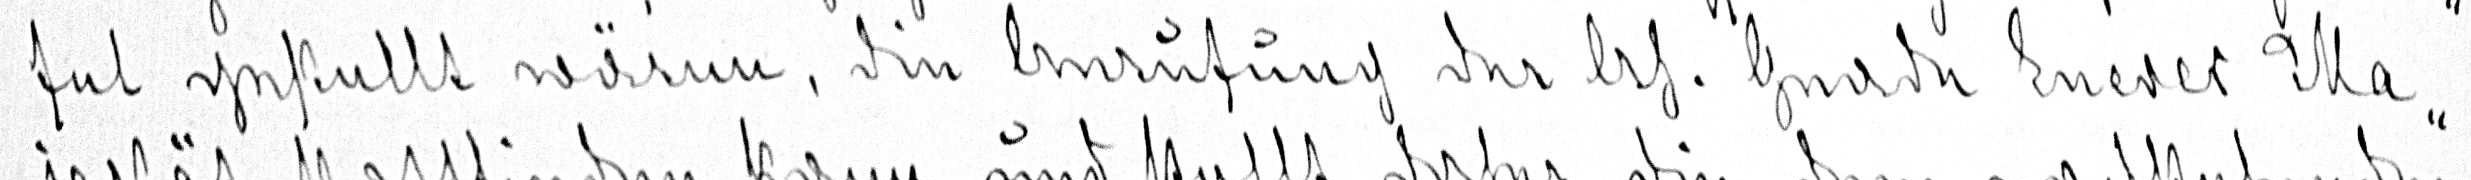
fel gestellt wären, die Anrufung der Ah. Gnade Euerer Ma¬
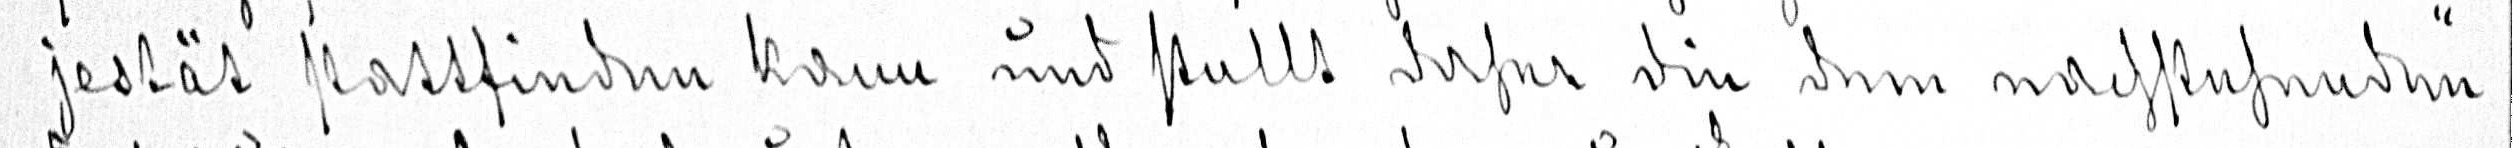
jestät stattfinden kann und stellt daher die dem nachstehenden
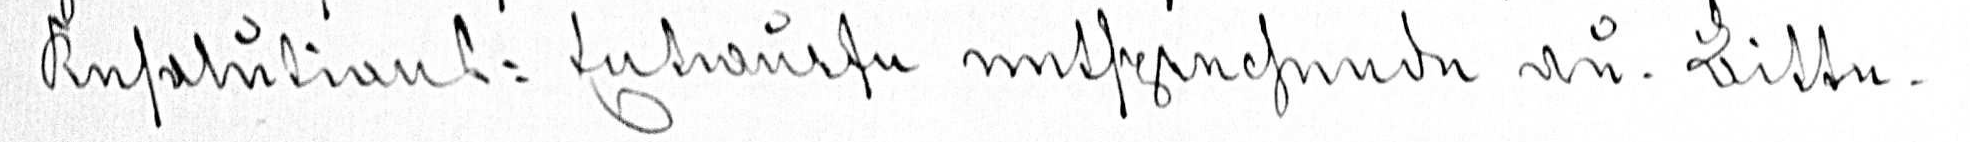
Resolutions-Entwurfe entsprechende au. Bitte.
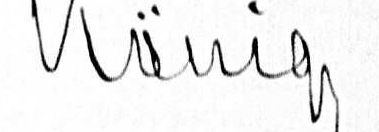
König
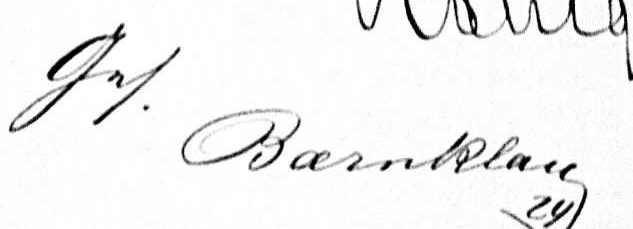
Ges. Baernklau
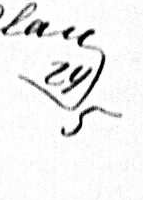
24/5
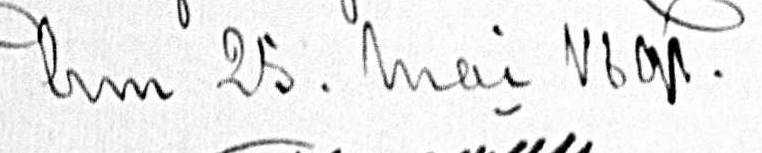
Am 25. Mai 1891
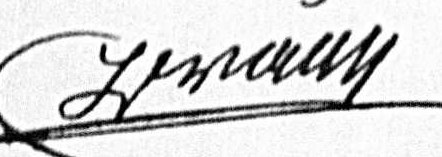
Wraun
